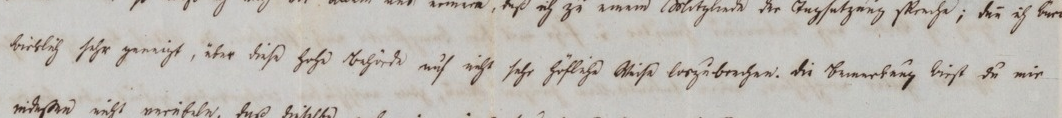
wirklich sehr geneigt, über diese hohe Behörde auf nicht sehr höfliche Weise loszubrechen. Die Bemerkung wirst du mir
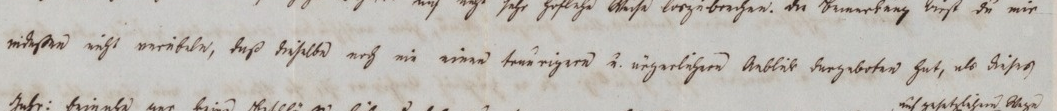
indessen nicht verübeln, daß dieselbe noch nie einen traurigern u. ärgerlichern Anblick dargeboten hat, als dieses
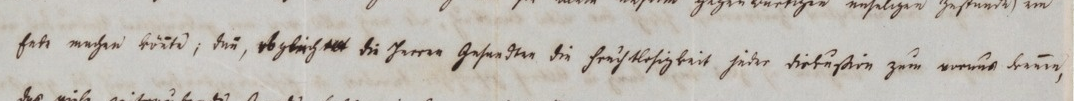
Ende machen könnte; dann, obgleich ... die Herren Gesandten die Fruchtlosigkeit jeder Diskussion zum voraus kennen,
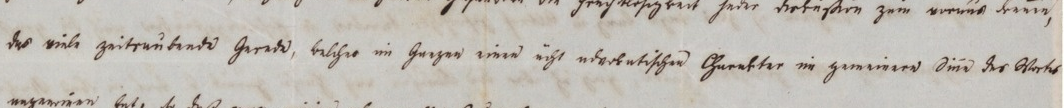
das viele zeitraubende Gerede, welches im Ganzen einen ächt advokatischen Charakter im gemeinern Sinne des Wortes
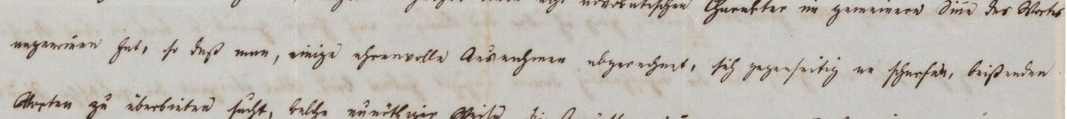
angenommen hat, so daß man, einige ehrenvolle Ausnahmen abgerechnet, sich gegenseitig an scharfen, beißenden
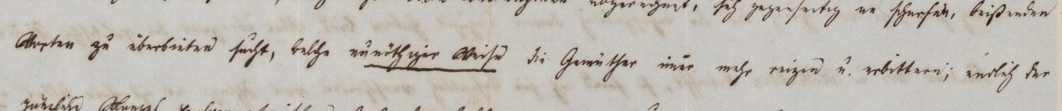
Worten zu überbieten sucht, welche unnöthiger Weise die Gemüther immer mehr reizen u. erbittern; endlich der
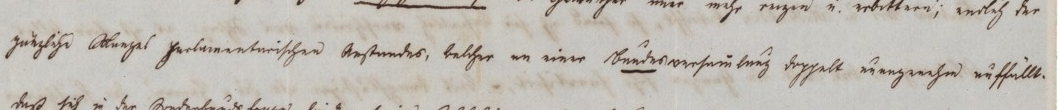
gänzliche Mangel parlamentarischen Anstandes, welcher an einer Bundesversammlung doppelt unangenehm auffällt.
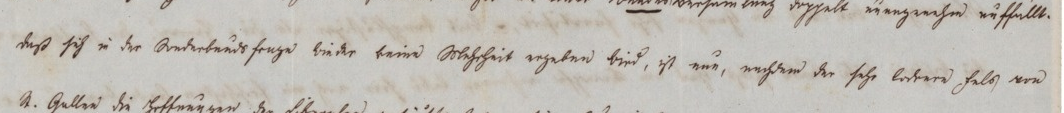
Daß sich in der Sonderbundsfrage wieder keine Mehrheit ergeben wird, ist nun, nachdem der sehr lockere Fels von
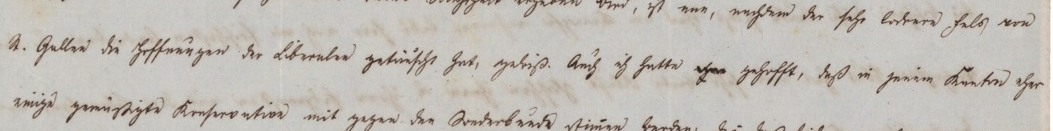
St. Gallen die Hoffnungen der Liberalen getäuscht hat, gewiß. Auch ich hatte gehofft, daß in jenem Kanton eher
